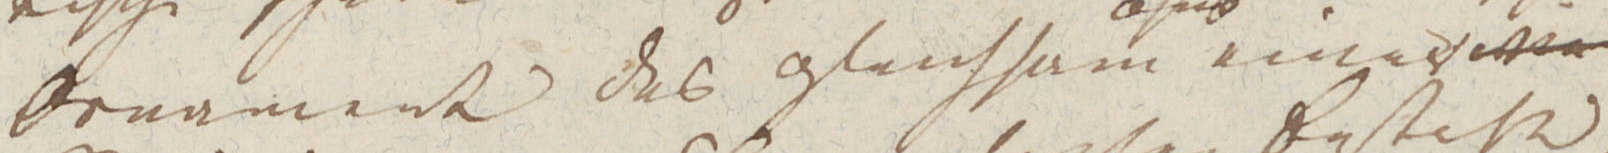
Ornament das gleichsam aus einer wie-
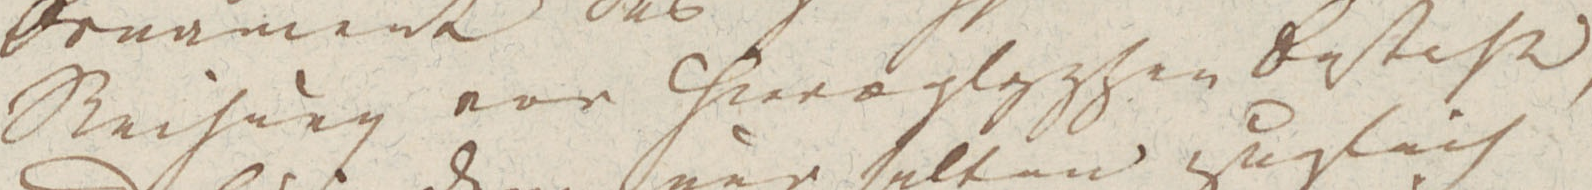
Reihung vor Hieroglyphen besteht,
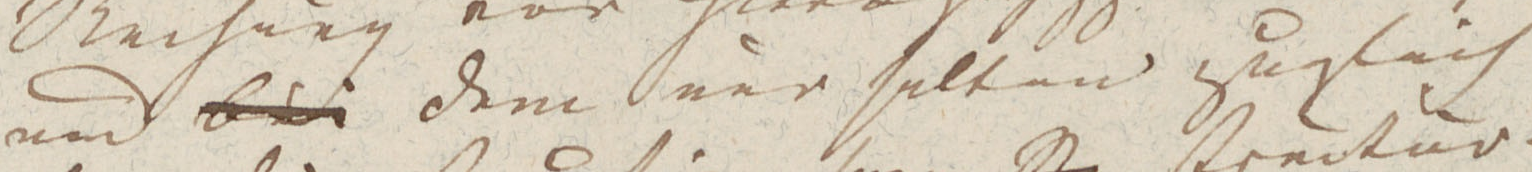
und bei dem nur selten zugleich
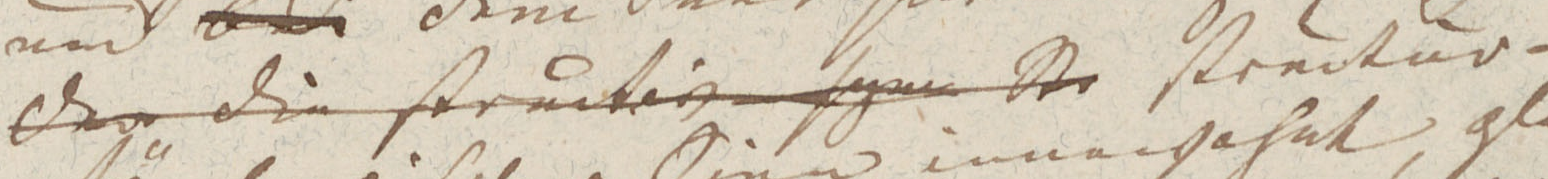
der die structiv-sym St structur-
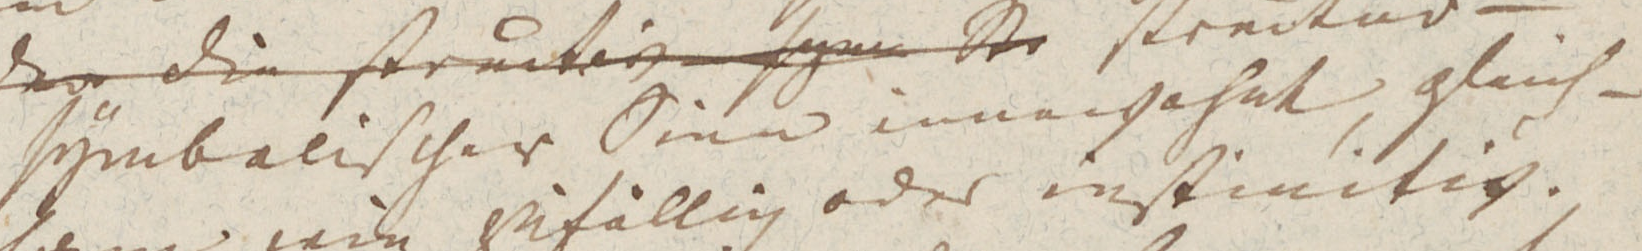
symbolischer Sinn innewohnt, gleich-
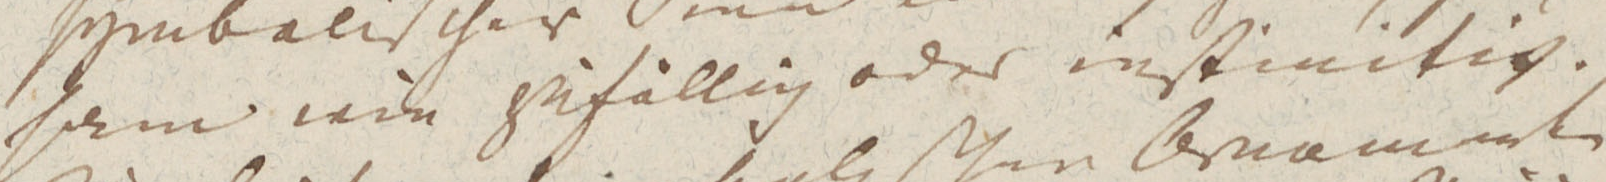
sam wie zufällig oder instinctiv.
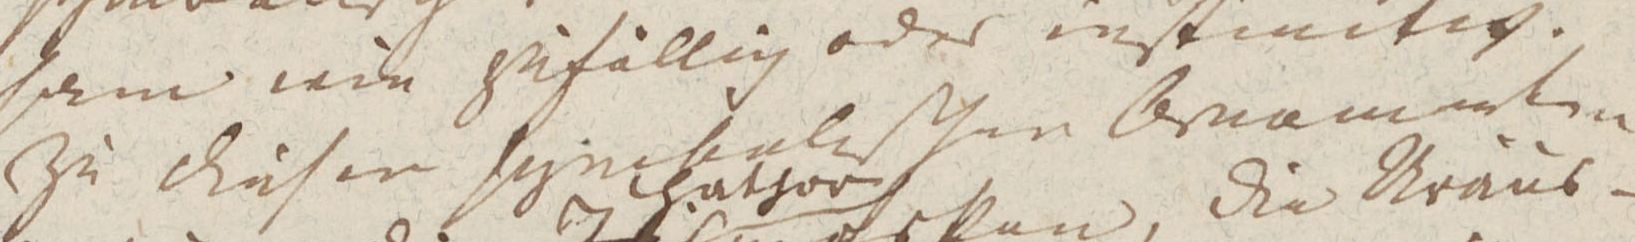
Zu diesen symbolischen Ornamenten
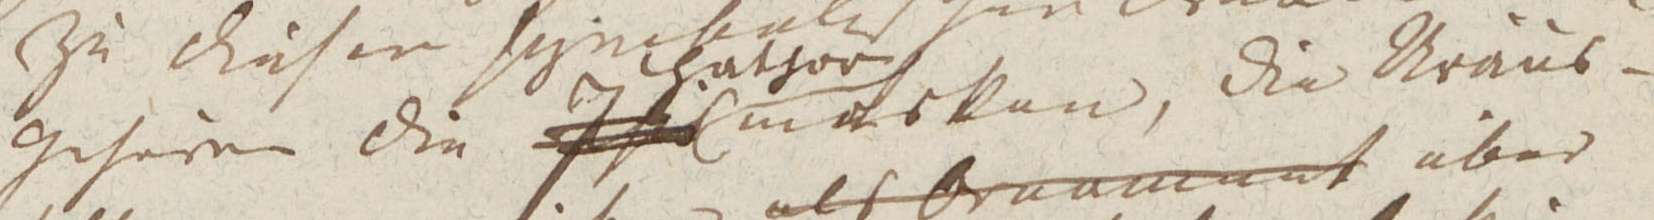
gehören die IsisHathormasken, die Uräus-
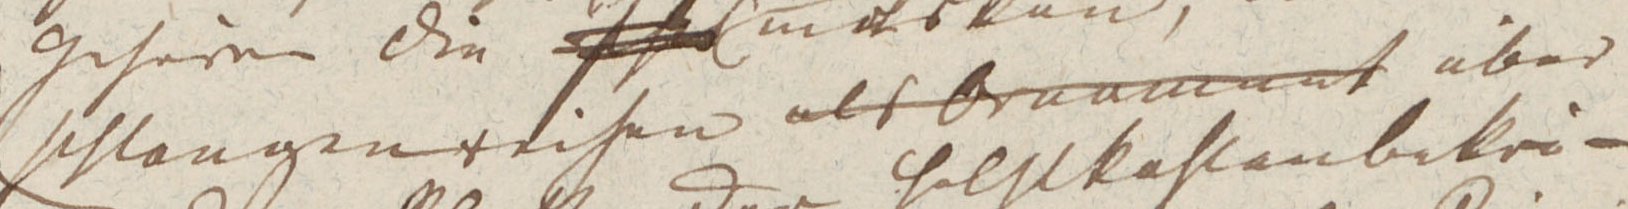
schlangenreichen als Ornament über
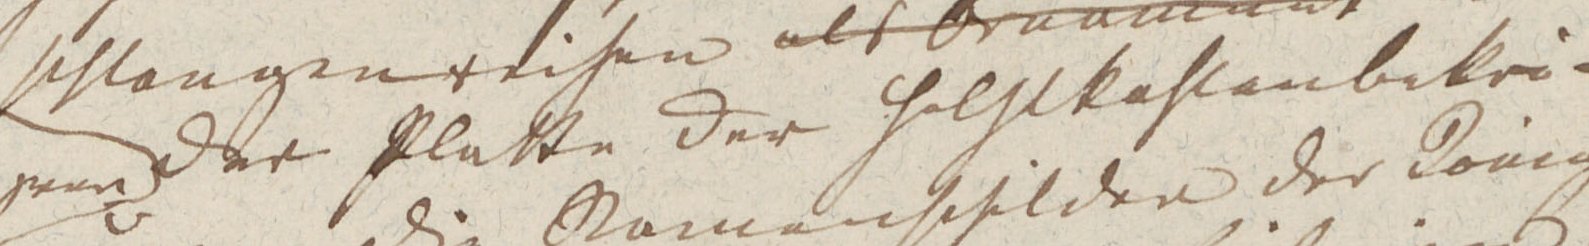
der Platte der Holhlkehlenbekrö-
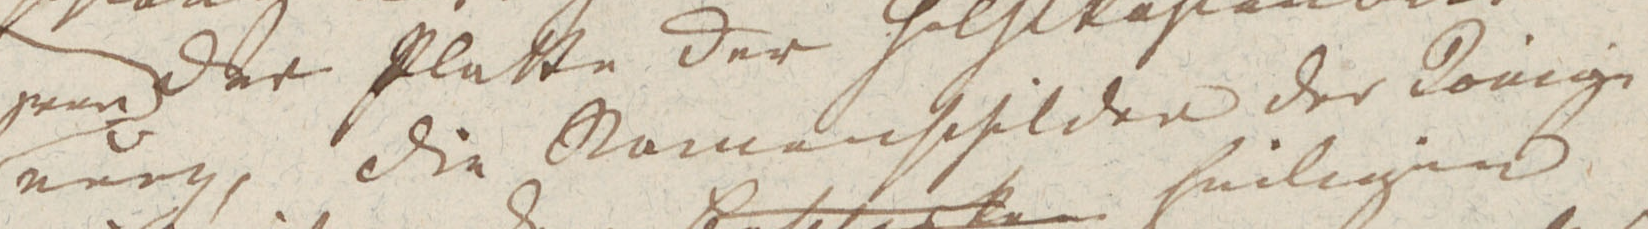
nung, die Namenschilder der Könige
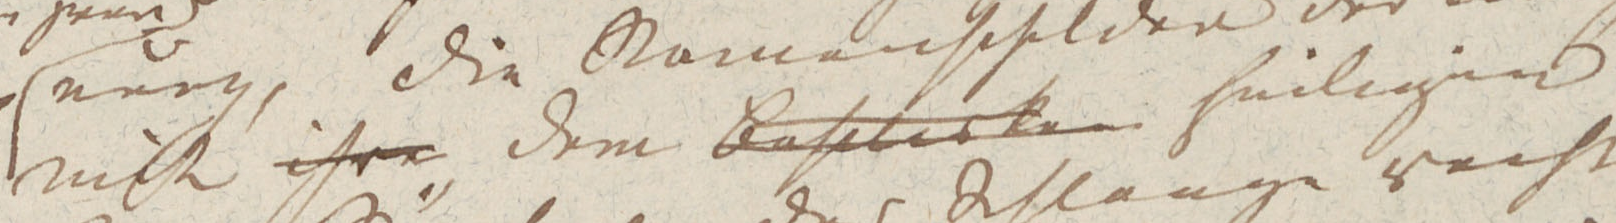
mit ihre dem Basilisken heiligen
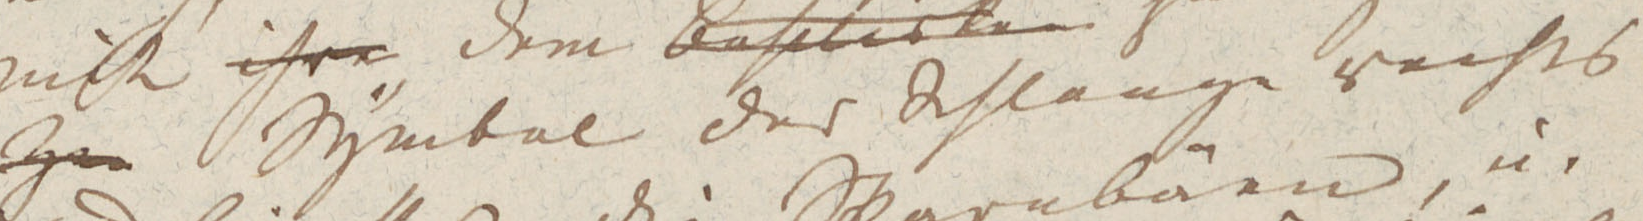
Z Symbol der Schlange rechts
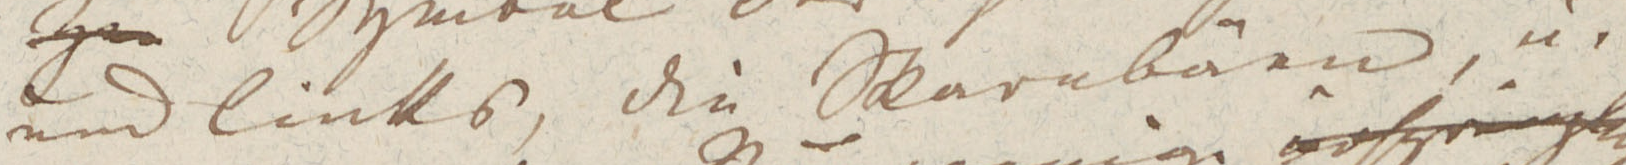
und links, die Skarabäen, u.
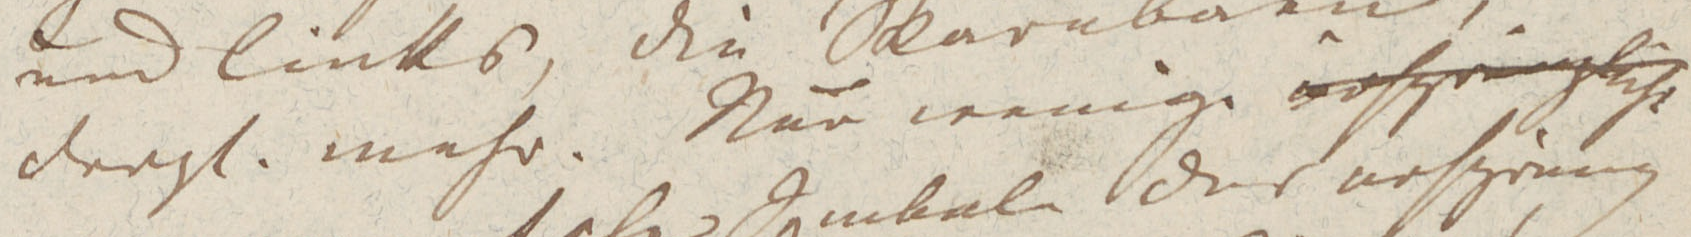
dergl. mehr. Nur wenig ursprüngliche
